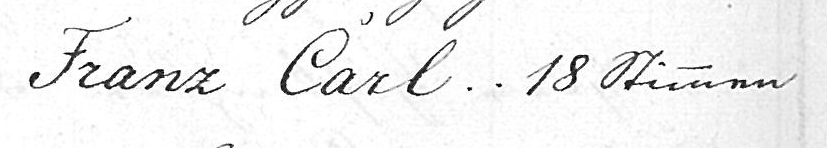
Franz Carl . . 18 Stimmen
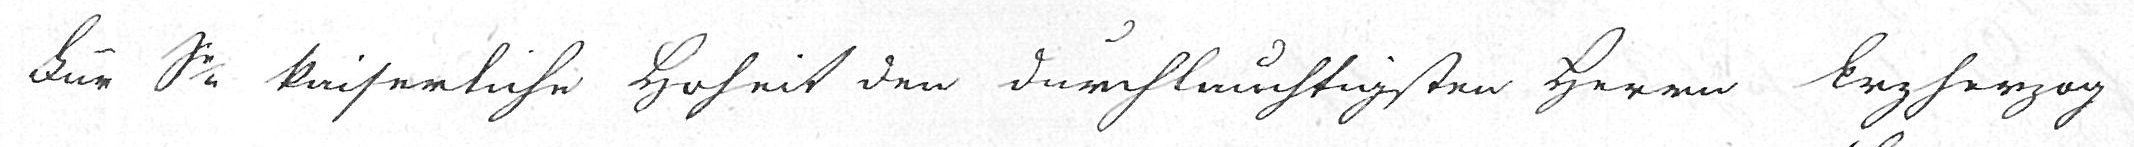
Für Sr. kaiserliche Hoheit den durchlauchtigsten Herrn Erzherzog
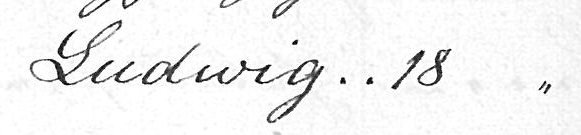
Ludwig . . 18 "
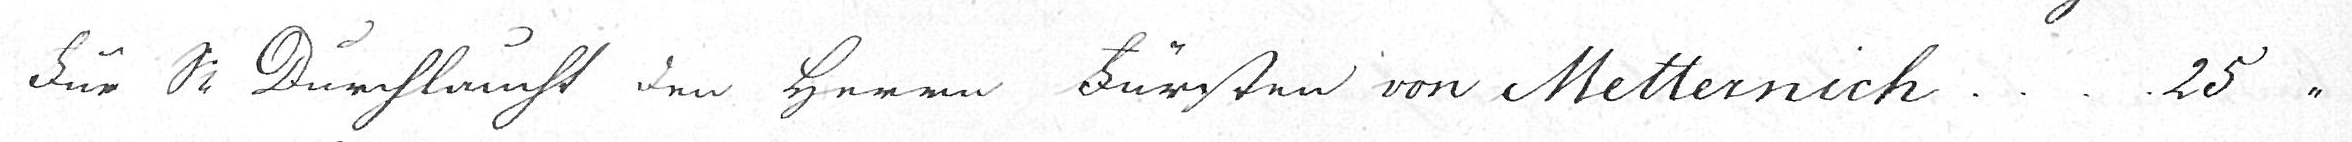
Für Sr. Durchlaucht den Herrn Fürsten von Metternich . . . . 25 "
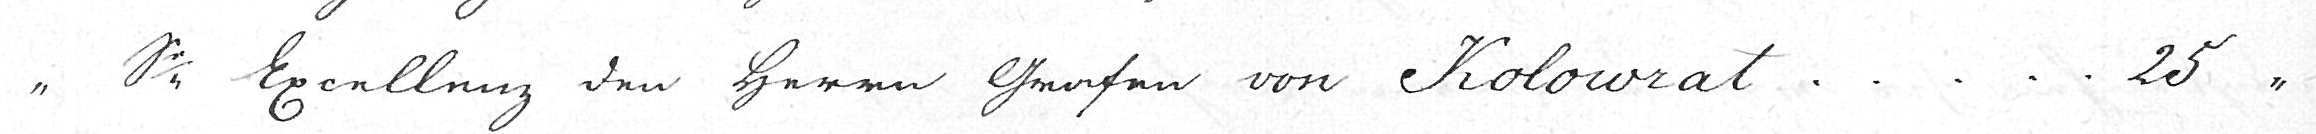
Für Sr. Excellenz den Herrn Grafen von Kolowrat . . . . . 25 "
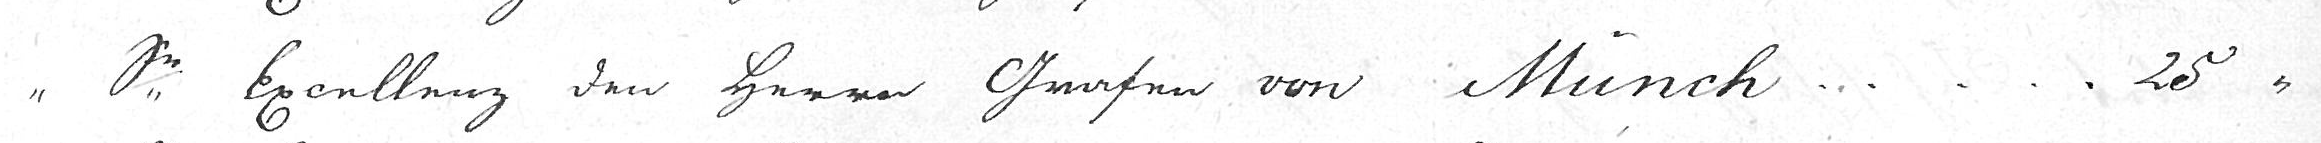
Für Sr. Excellenz den Herrn Grafen von Münch . . . . . 25 "
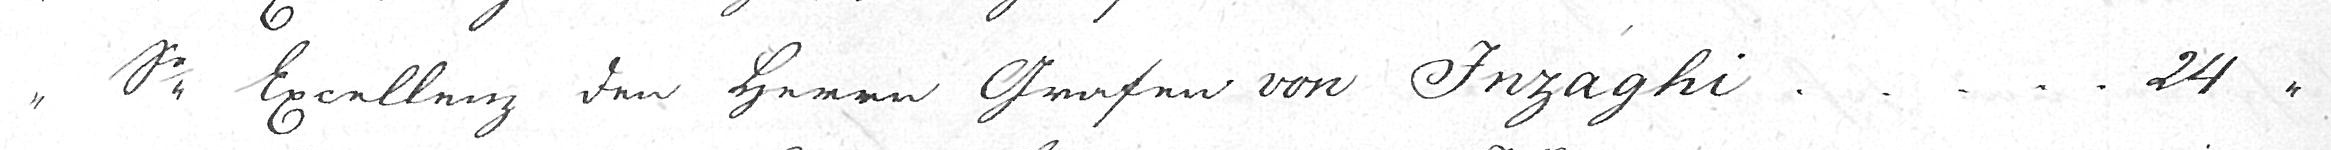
Für Sr. Excellenz den Herrn Grafen von Inzaghi . . . . . 24 "
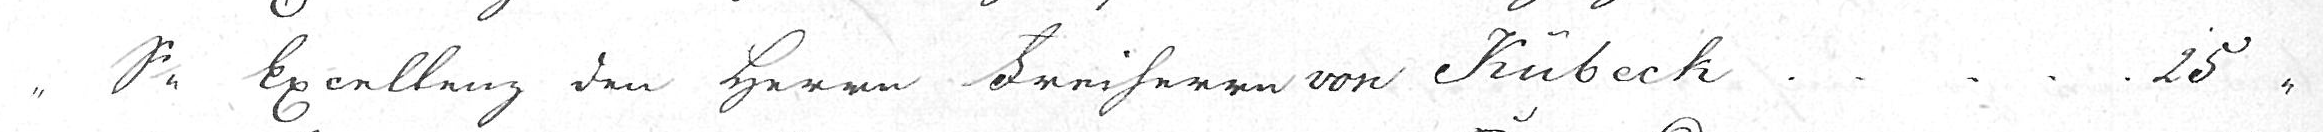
Für Sr. Excellenz den Herrn Freiherrn von Kübeck . . . . . 25 "
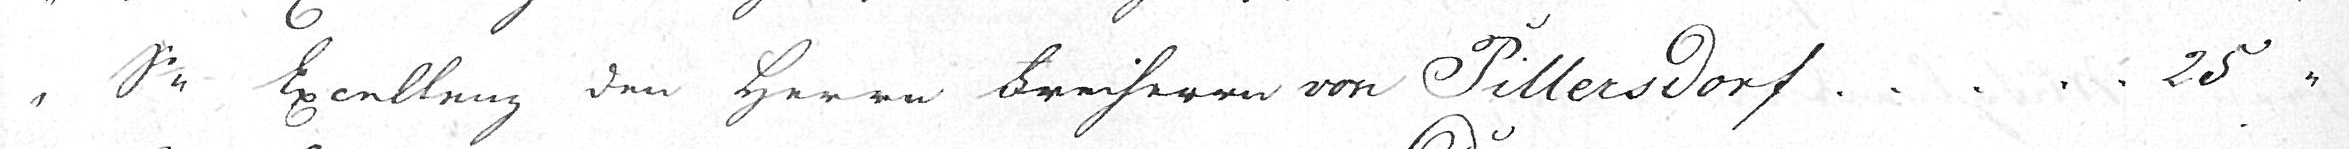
Für Sr. Excellenz den Herrn Freiherrn von Pillersdorf . . . . . 25 "
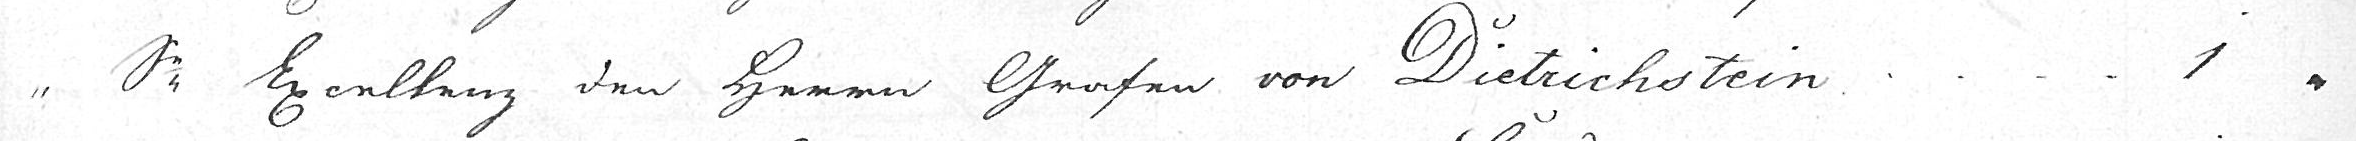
Für Sr. Excellenz den Herrn Grafen von Dietrichstein . . . . 1 "
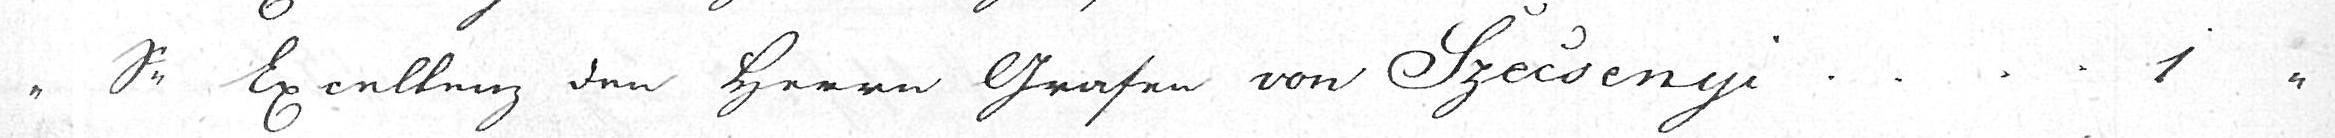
Für Sr. Excellenz den Herrn Grafen von Szecsenyi . . . . 1 "
